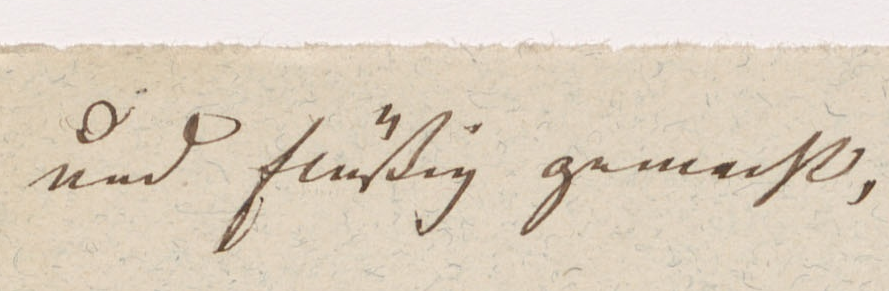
und flüssig gemacht,
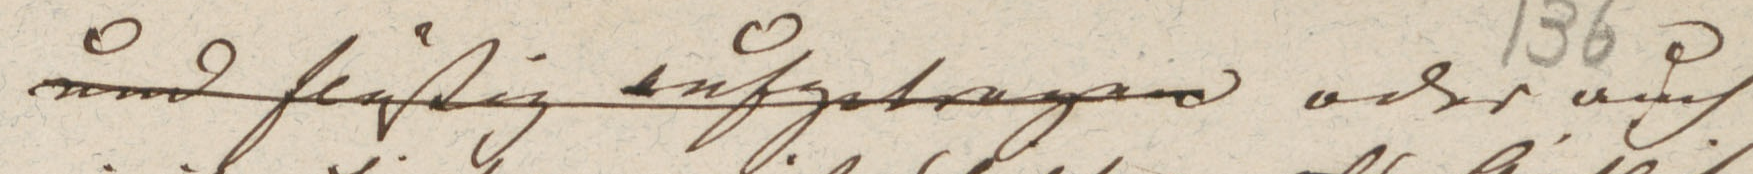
und flüssig aufgetragen oder auch
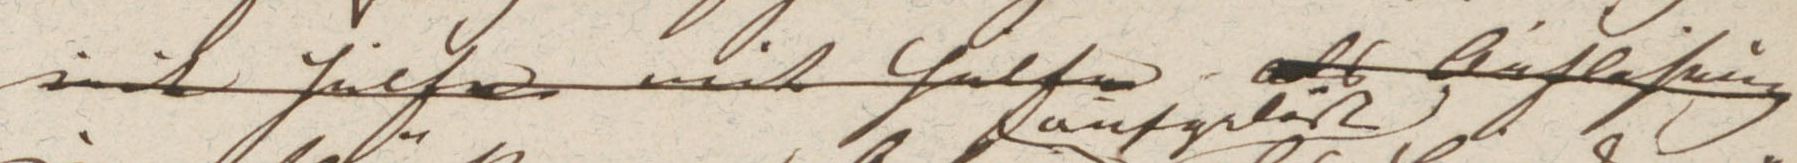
mit Hülfe mit Hülfe als Auflösung
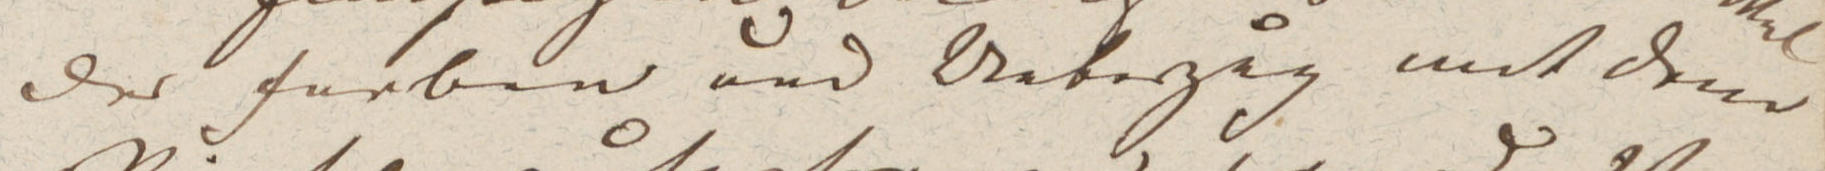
der Farben und Ueberzug mit dem
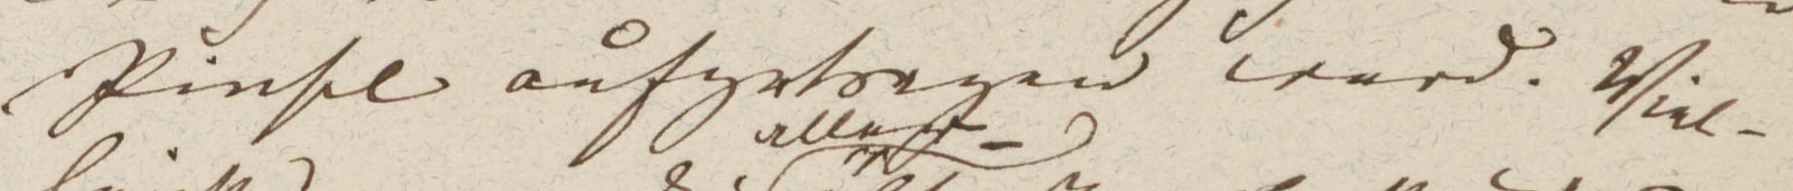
Pinsel aufgetragen ward. Viel-
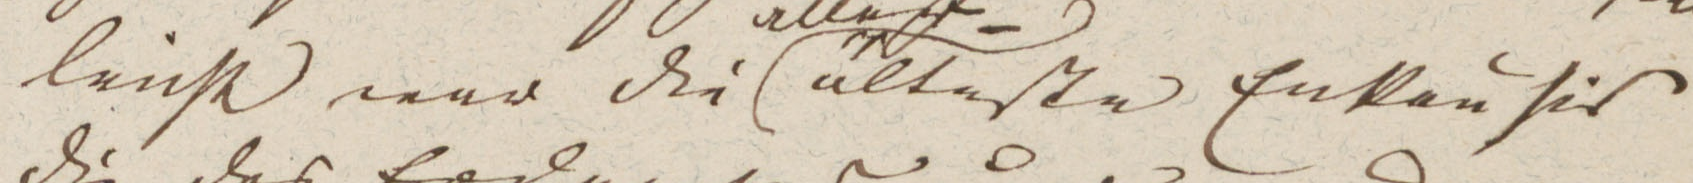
leicht war die aller-älteste Enkausis
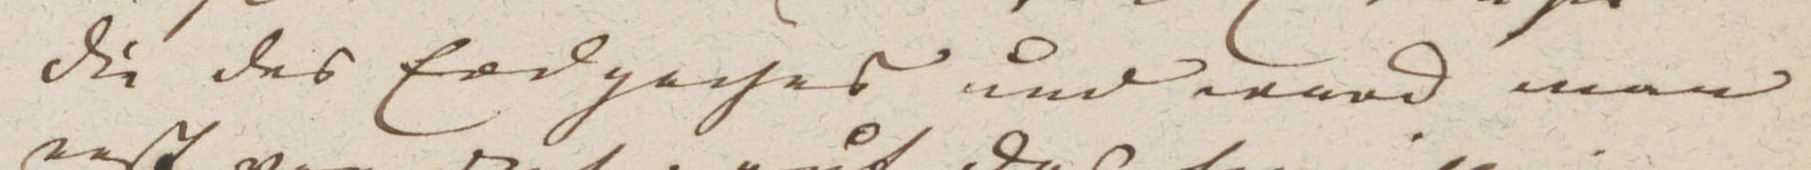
die des Erpeches und ward man
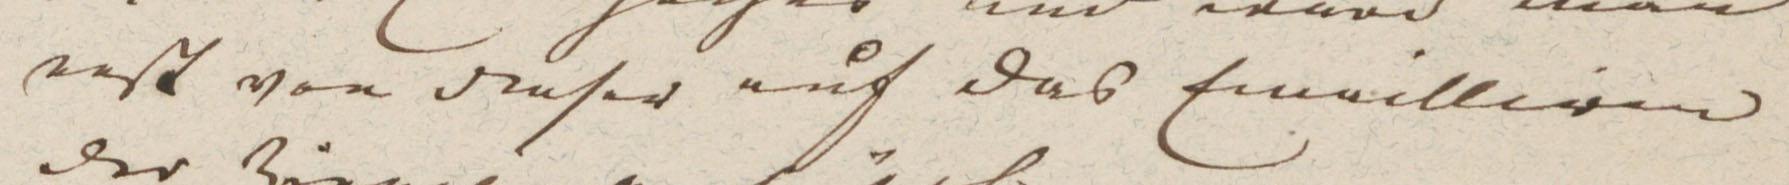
erst von dieser auf das Emailliren
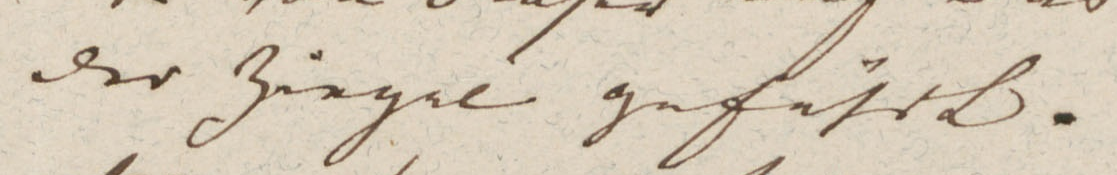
der Ziegel geführt.
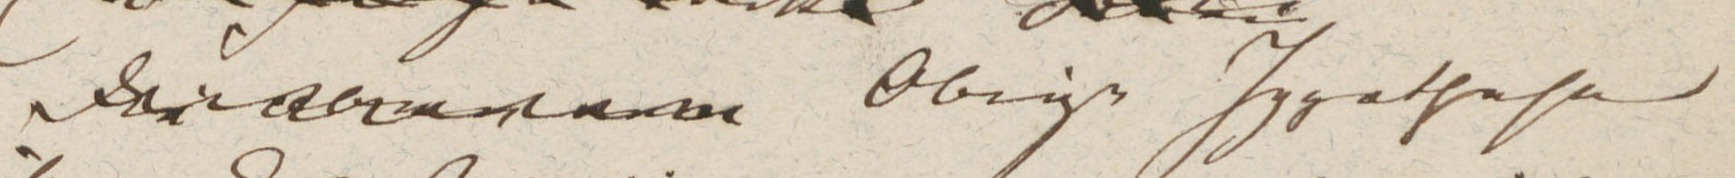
Die oben Obige Hypothese
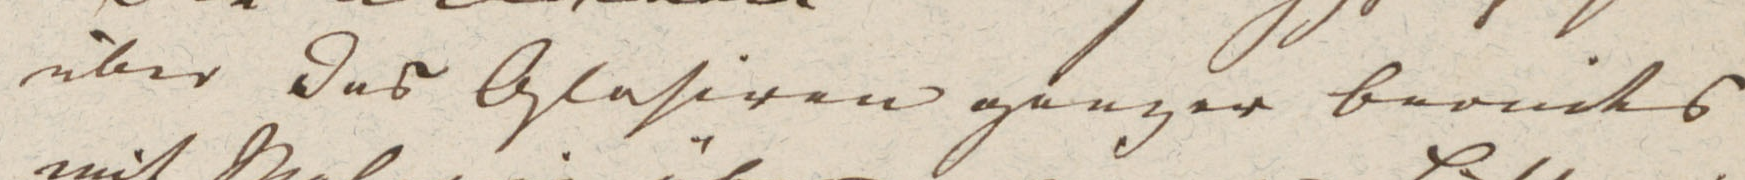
über das Glasiren ganzer bereits
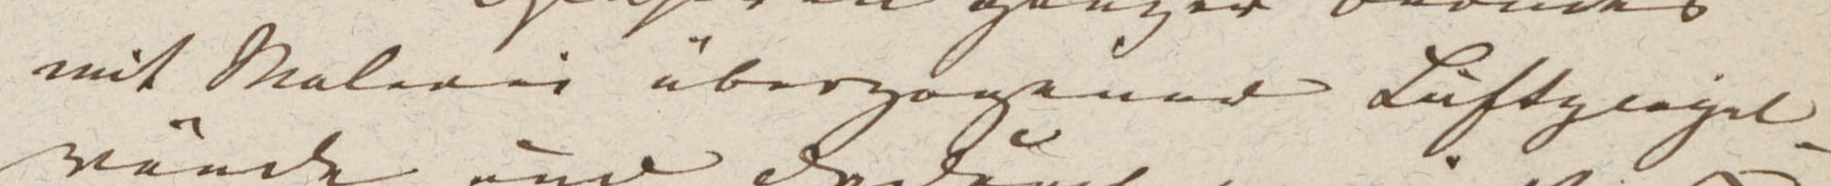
mit Malerei überzogener Luftziegel-
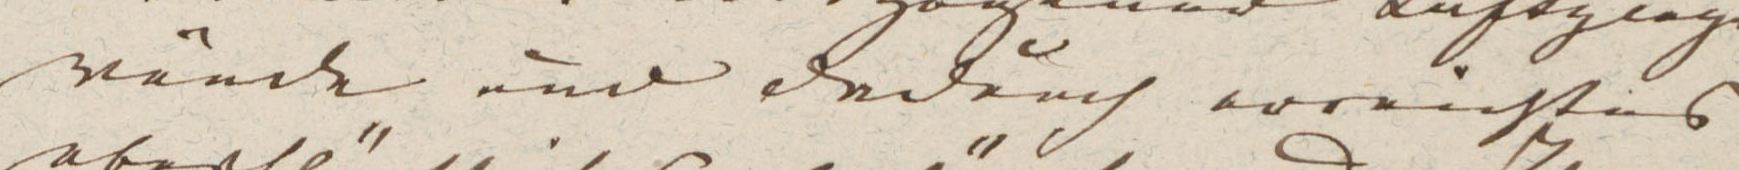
wände und dadurch erreichtes
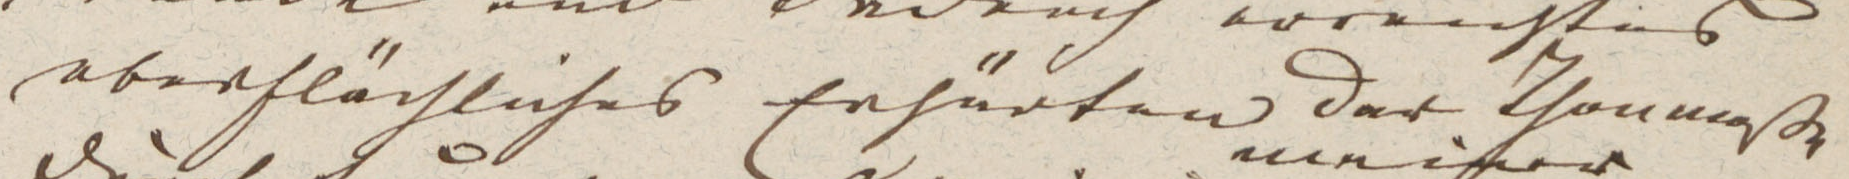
oberflächliches Erhärten der Thonmasse
